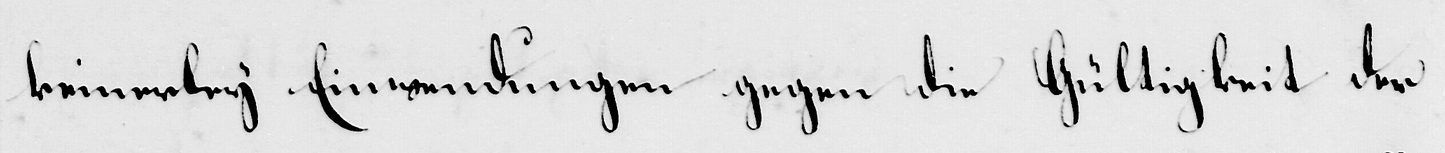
keinerley Einwendungen gegen die Gültigkeit der
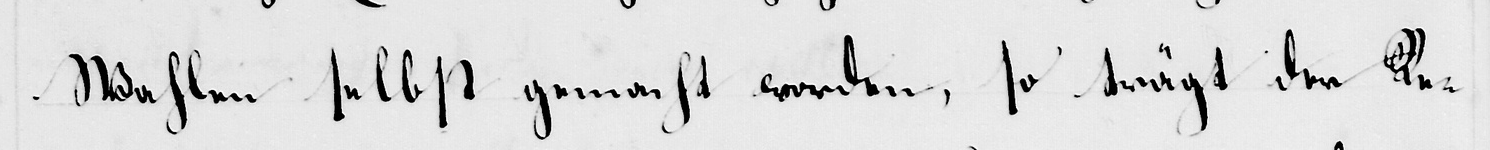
Wahlen selbst gemacht worden, so trägt der Re¬
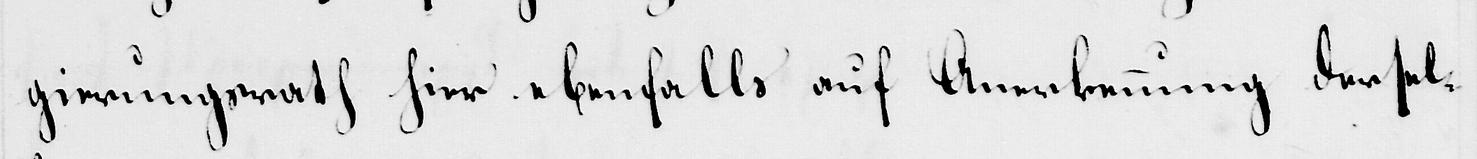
gierungsrath hier ebenfalls auf Anerkennung dersel¬
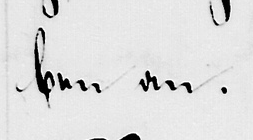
ben an.
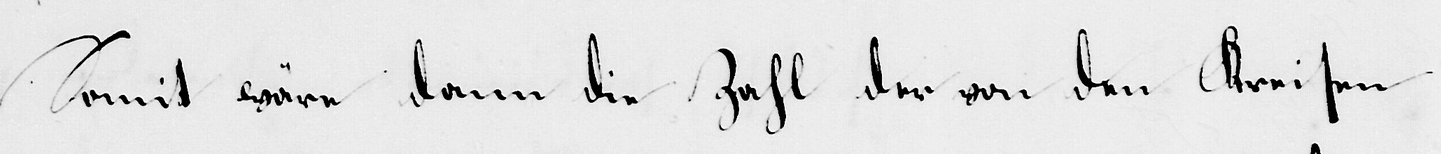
Somit wäre dann die Zahl der von den Kreisen
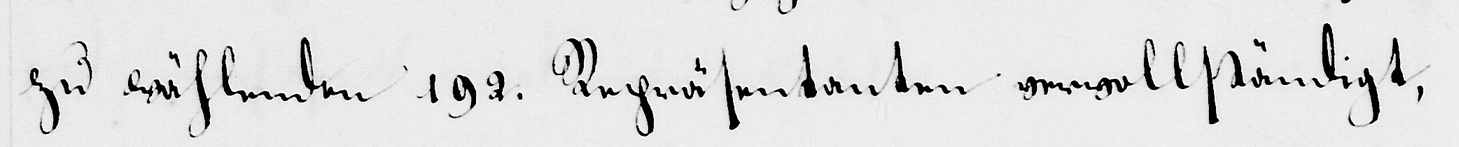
zu wählenden 192. Repräsentanten vervollständigt,
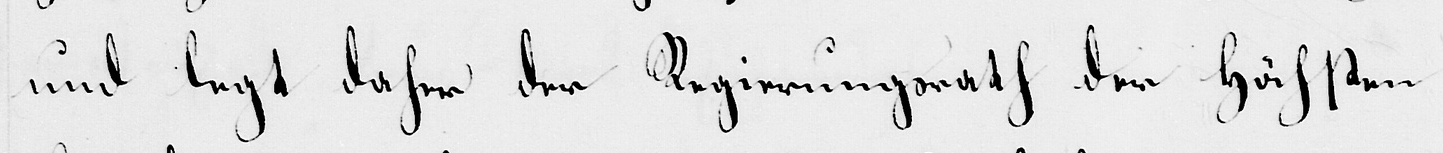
und legt daher der Regierungsrath der Höchsten
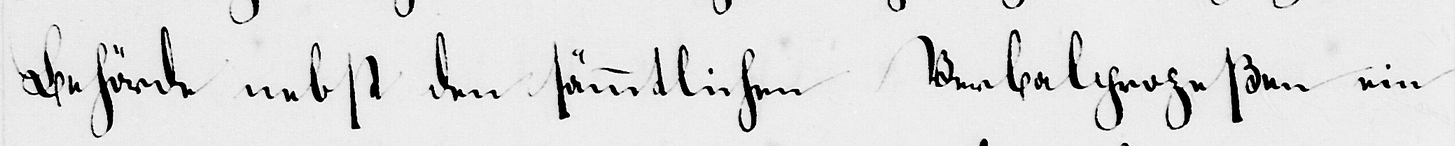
Behörde nebst den sämmtlichen Verbalprozeßen ein
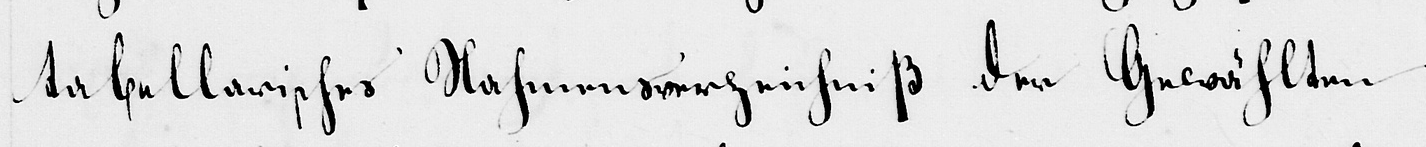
tabellarisches Nahmensverzeichniß der Gewählten
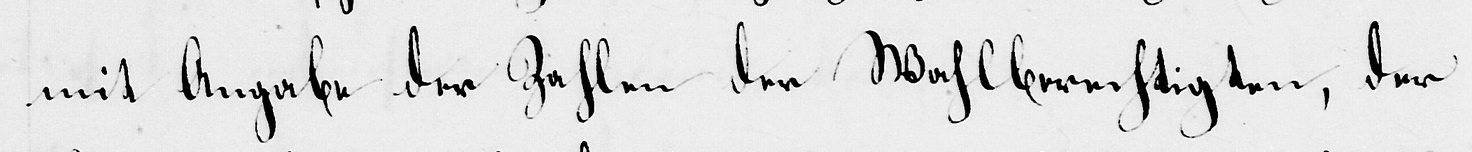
mit Angabe der Zahlen der Wahlberechtigten, der
